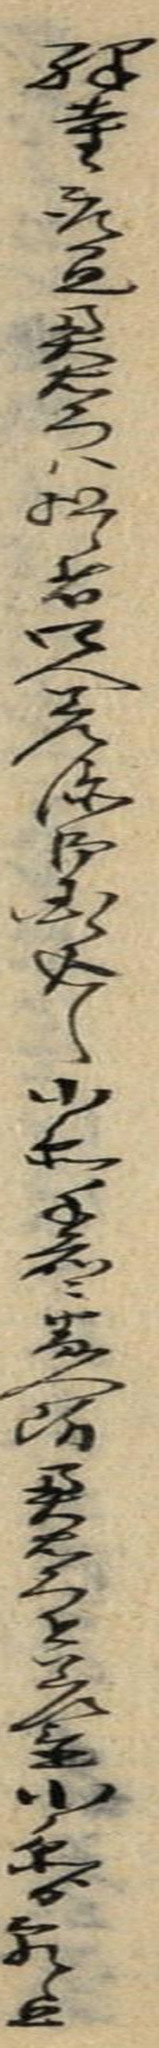駅寺へ取置奥右衛門は組之者四人差添御国へ返し小兵衛手前に番人附奥右衛門を差置小兵衛ゟ願之上
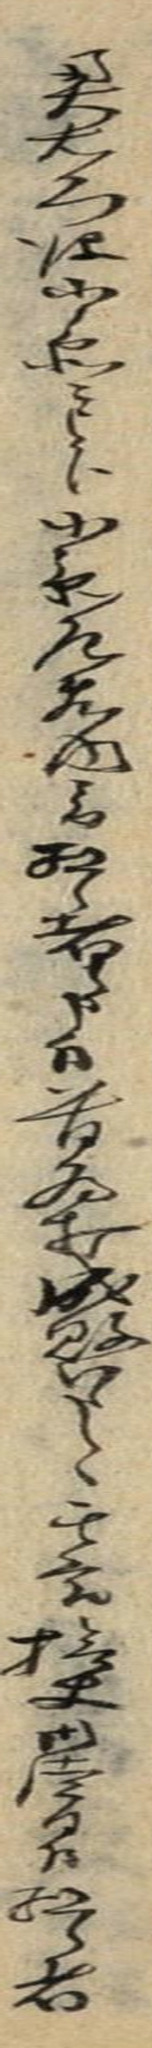奥右衛門儀小兵衛に被下小兵衛屋敷内にて組之者に申付首為打成敗いたし候其節検使御徒目付組之者
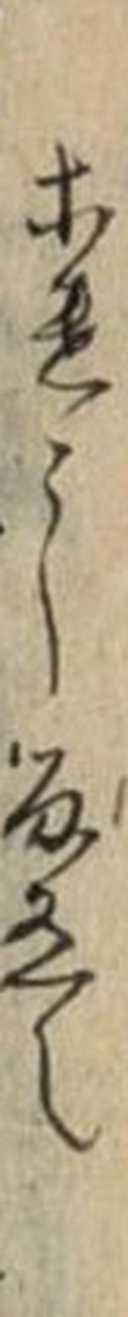等遣之留有之

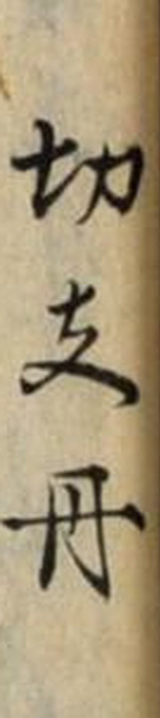切支丹
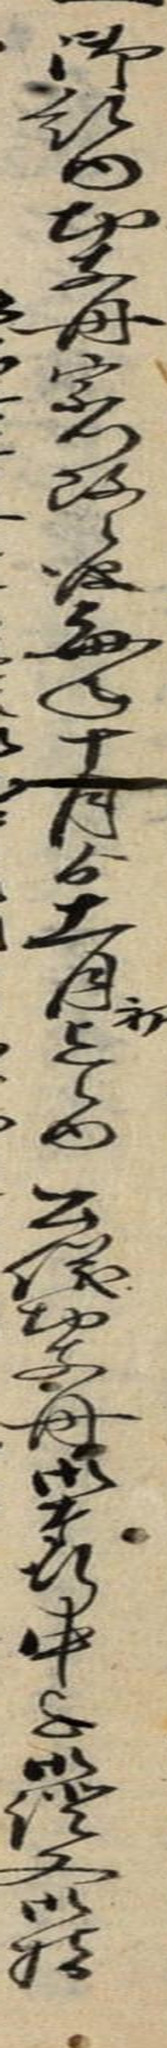一御領内切支丹宗門改之儀毎年十月ゟ十一月初迄之内公儀切支丹御奉行中迄御証文御指
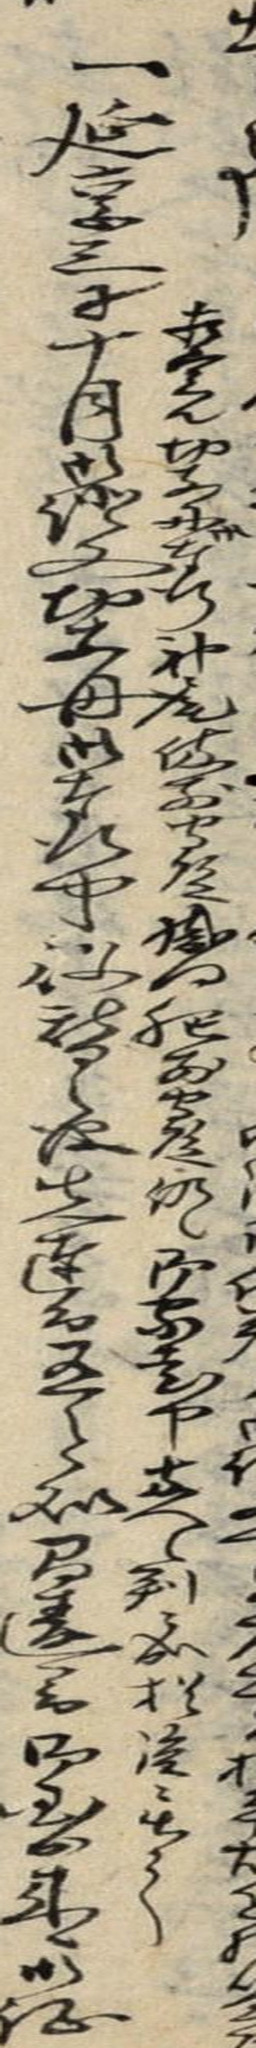一延享三刁十月御証文切支丹御奉行中役替之儀先達て有之候処間違候て御国ゟ来候御証
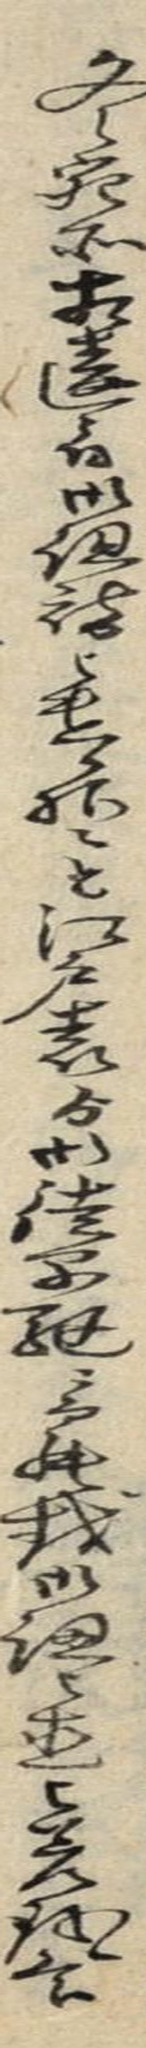文之宛所相違に付御認替被遣候様にと江戸表ゟ御徒早駆にて罷越御認被直被差越候節
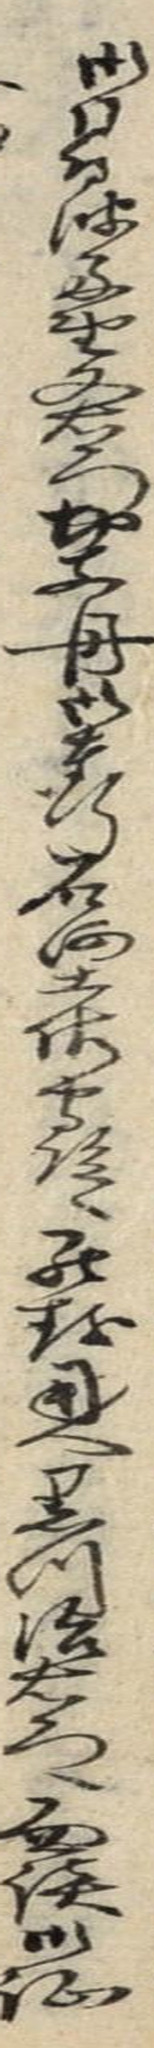御目付波多野又右衛門切支丹御奉行石河土佐守殿へ罷越用人黒川治右衛門へ面談御証
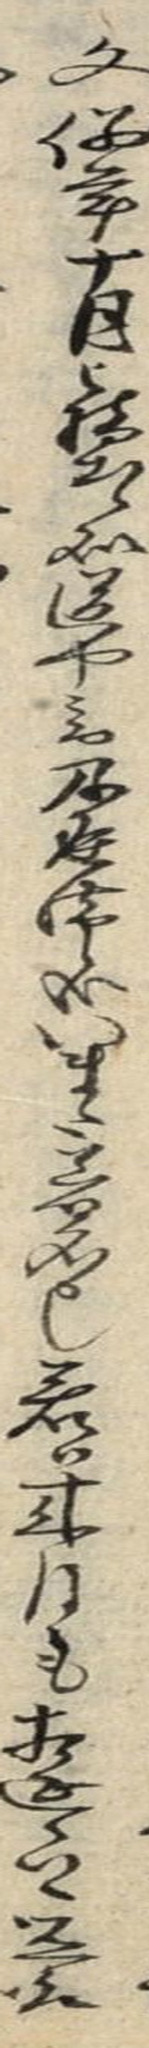文例年十月被指出候処道中にて及遅滞候哉いまた着不申候若は来月にも相延候はゝ宜取
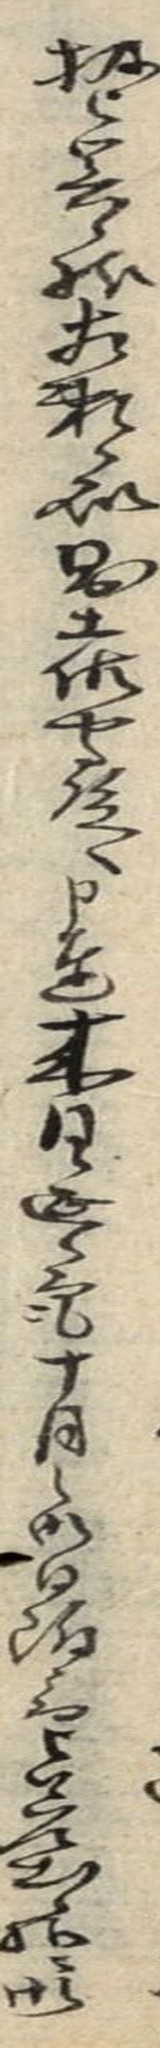扱被呉候様相願候処則土佐守殿へ申達来月に延候ても十月之御日附にて被差出候様に御
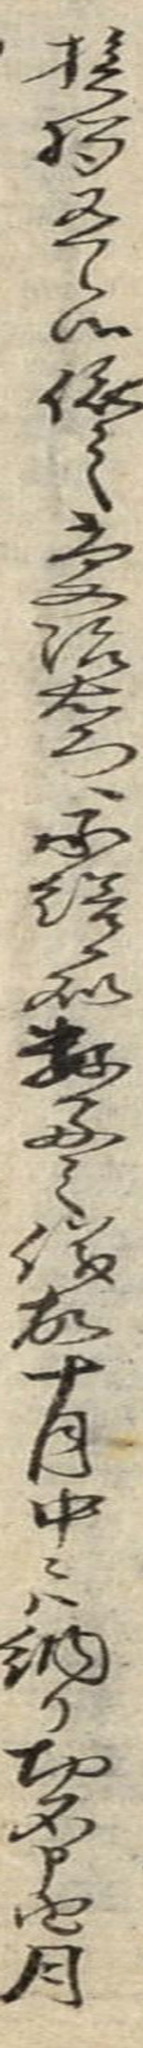挨拶有之候依之尚又治右衛門へ承繕候処数多之儀故十月中には納り切不申由月
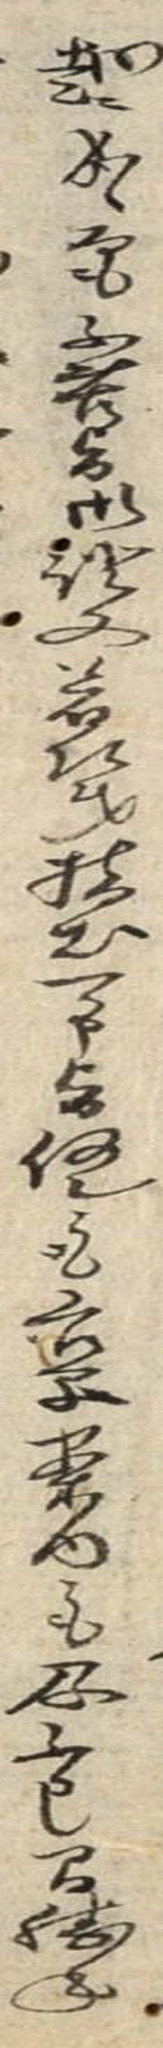越に成候ても不苦旨御証文着次第指出可申旨何レにも最早案内にも及不申候間勝手
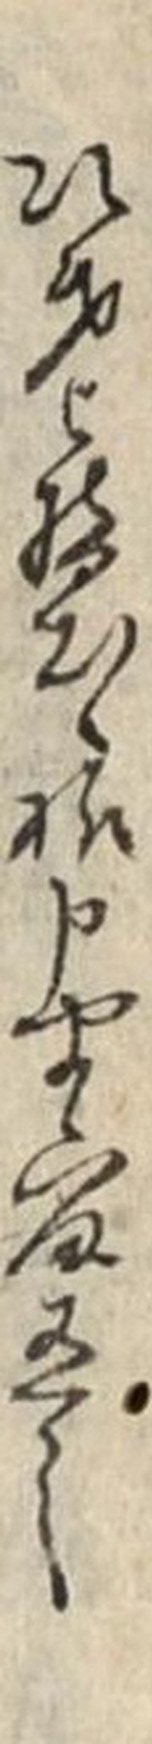次第被指出候様申聞候留有之
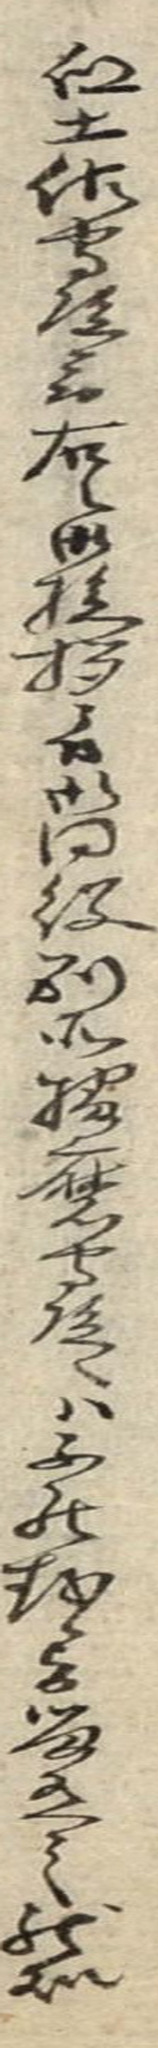但土佐守殿にて右之御挨拶に付御同役別所播磨守殿へは不罷越候旨留有之然処
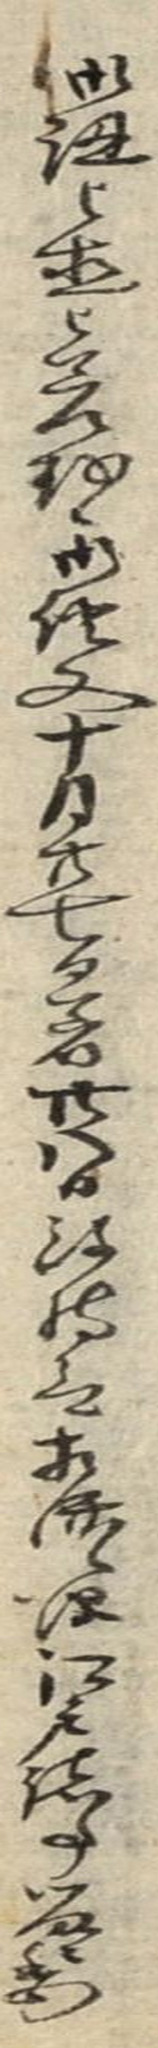御認被直被差越候御証文十月廿七日着廿八日持参相済候儀江戸諸事留に委
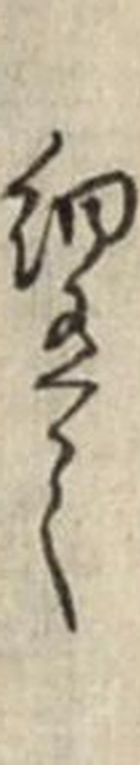細有之
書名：御停止異変死失
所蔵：福井県文書館 Fukui Prefectural Archives
